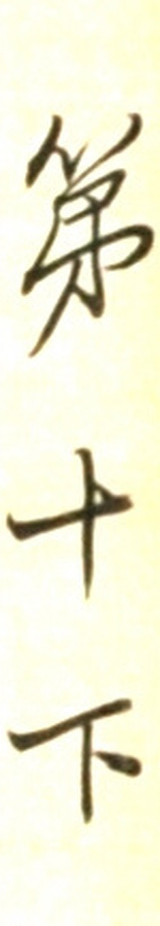第十下
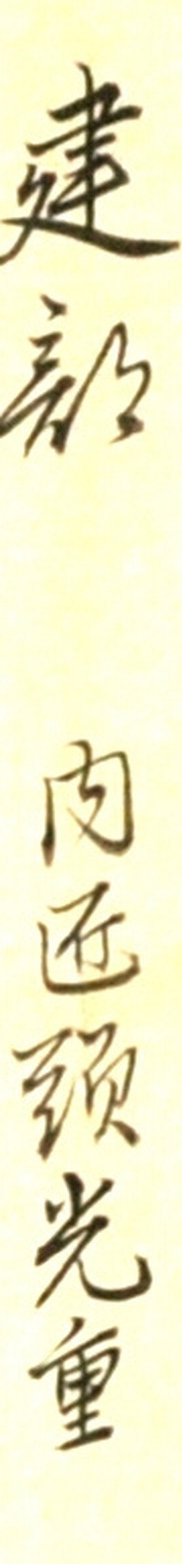建部内匠頭光重
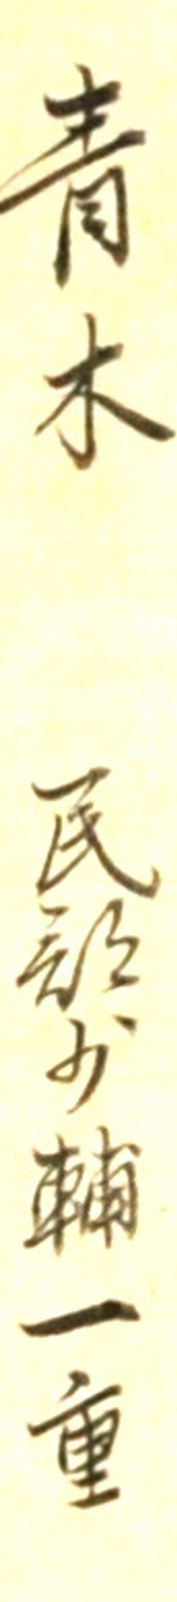青木民部少輔一重
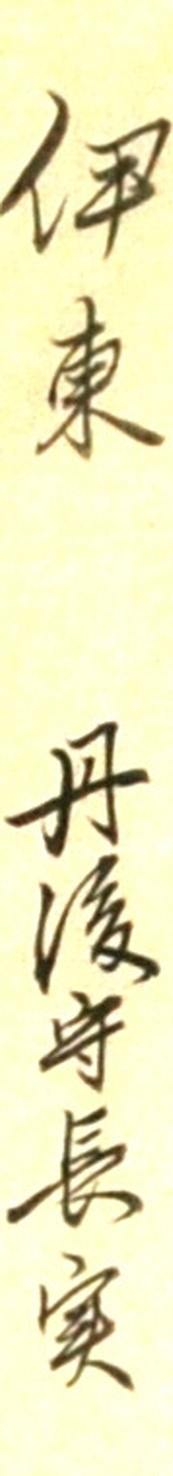伊東丹後守長実

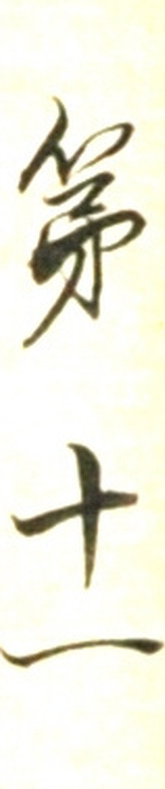第十一
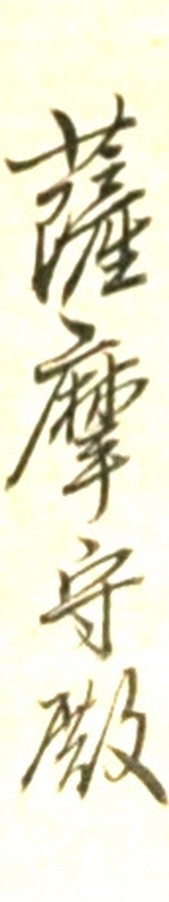薩摩守殿
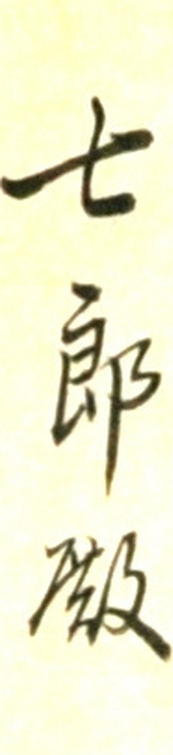七郎殿
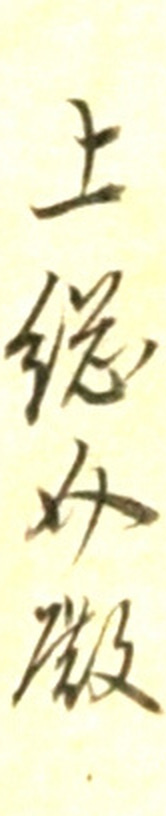上総介殿
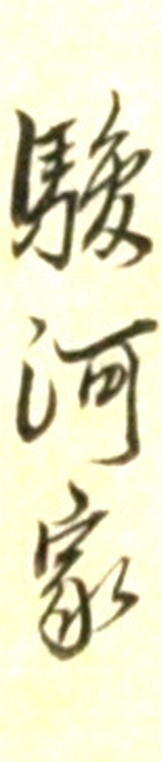駿河家

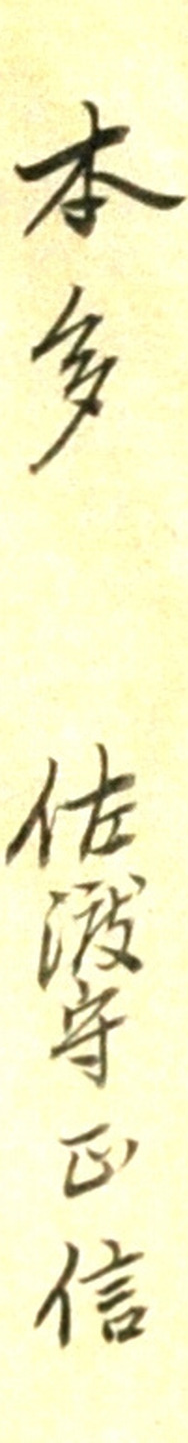本多佐渡守正信
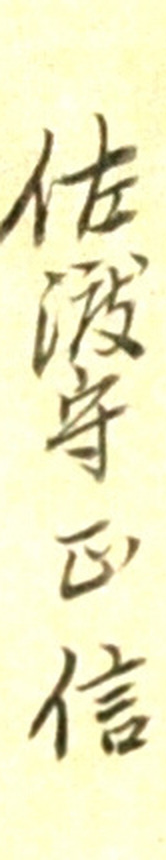本多佐渡守正信
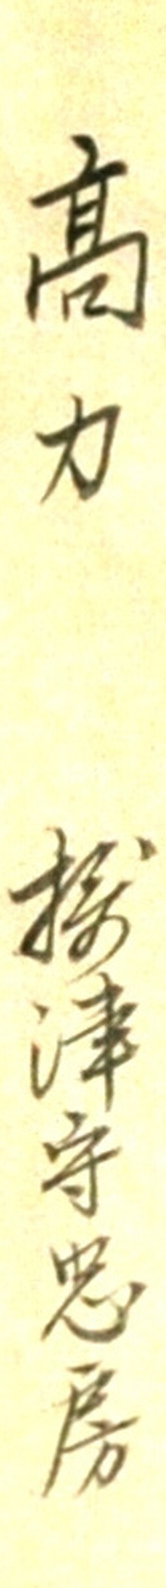高力摂津守忠房

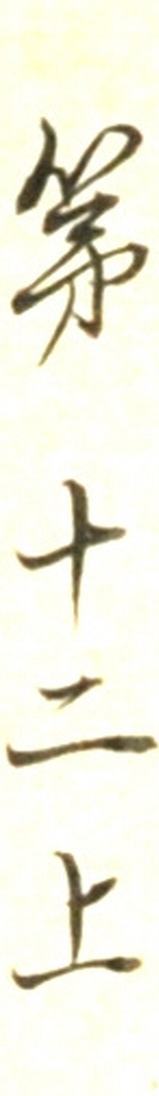第十二上
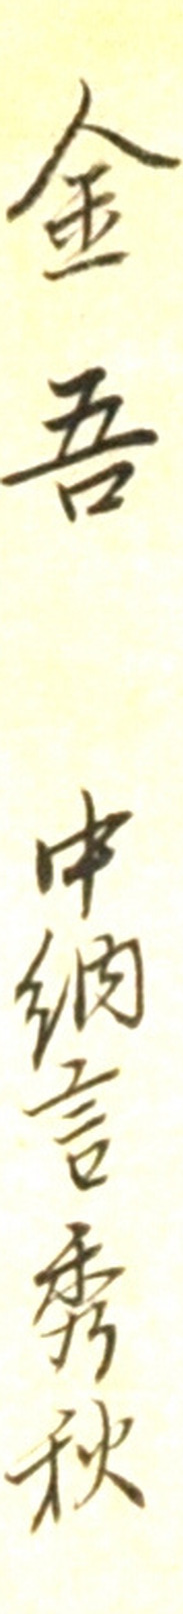金吾中納言秀秋
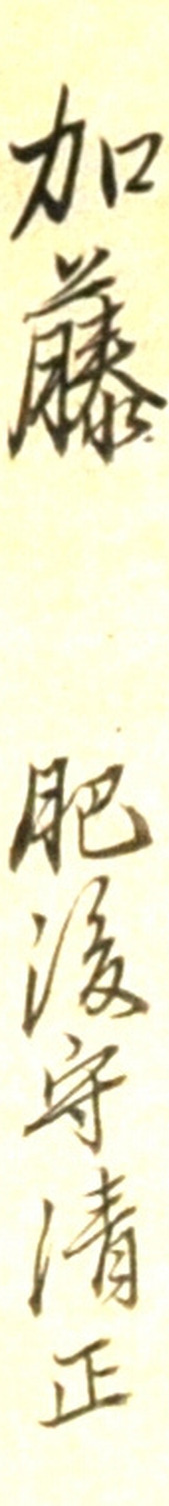加藤肥後守清正

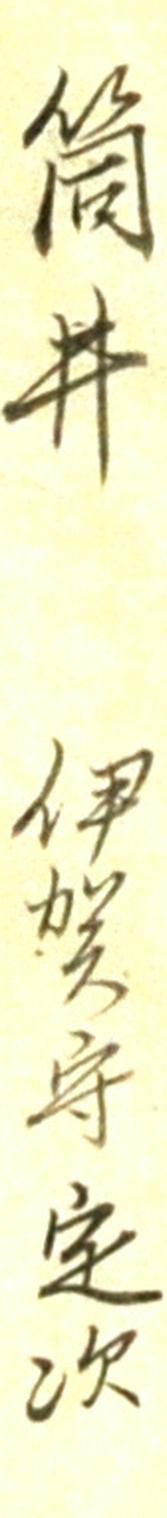筒井伊賀守定次
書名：藩翰譜（一）
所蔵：伊那市立高遠町図書館・合同会社AMANE
